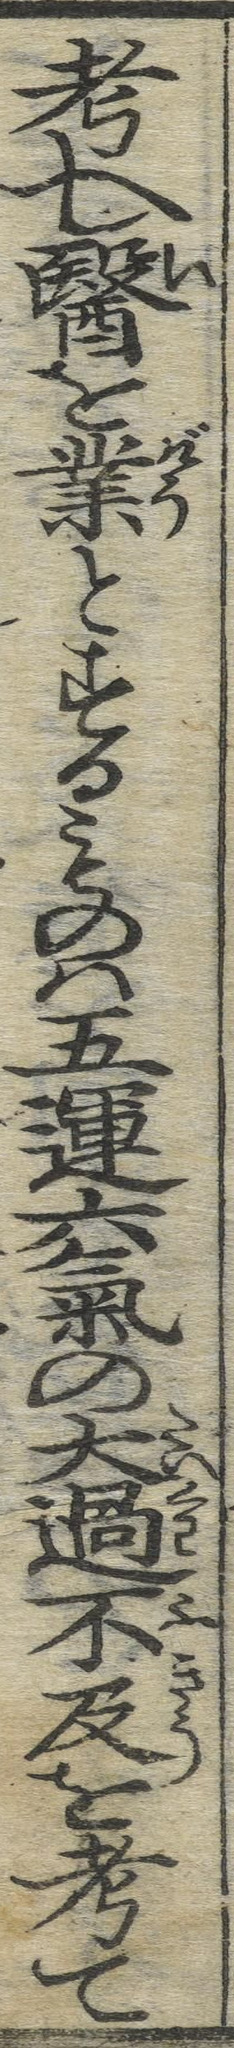考へし醫を業とするものは五運六気の大過不及を考て
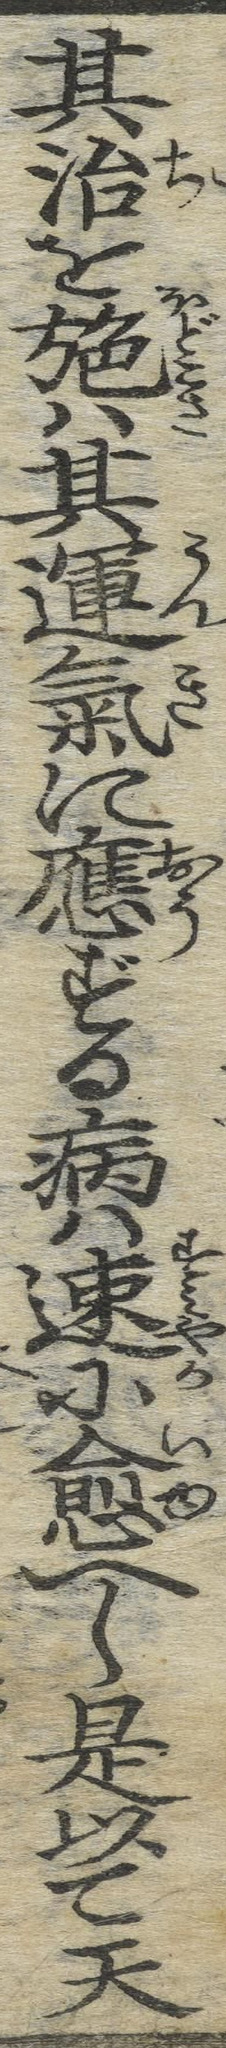其治を施は其運気に應ずる病は速に愈󠄀へし是以て天
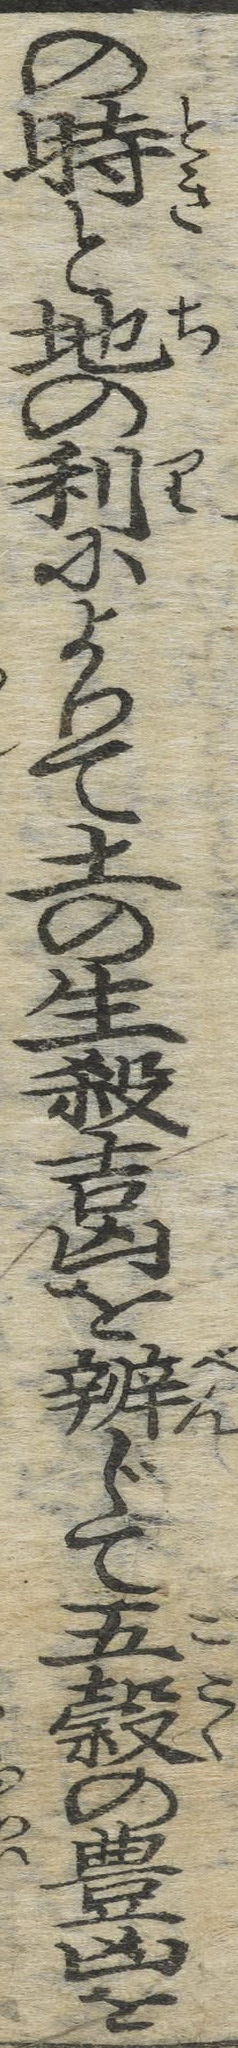の時と地の利によりて土の生殺吉凶を辨じて五穀の豊凶を
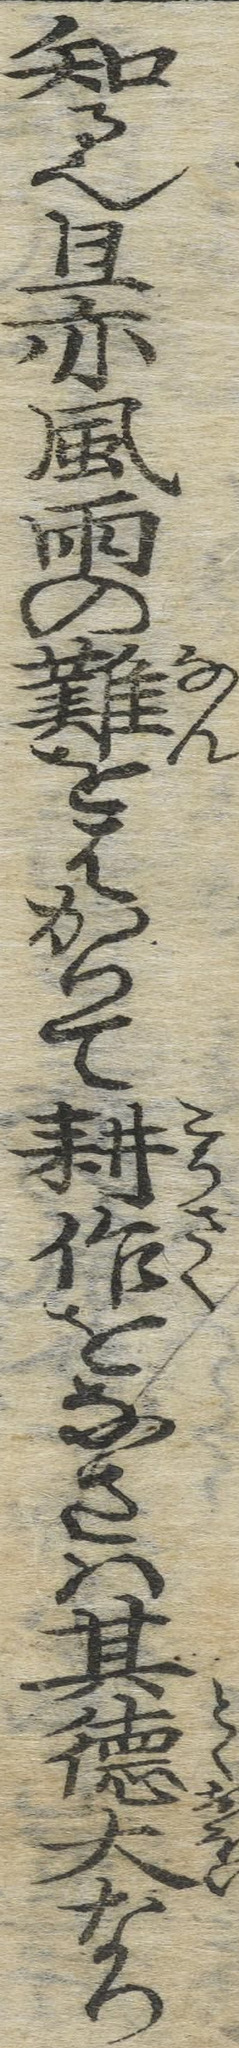知る也且亦風雨の難をはかりて耕作をなさは其徳大なり
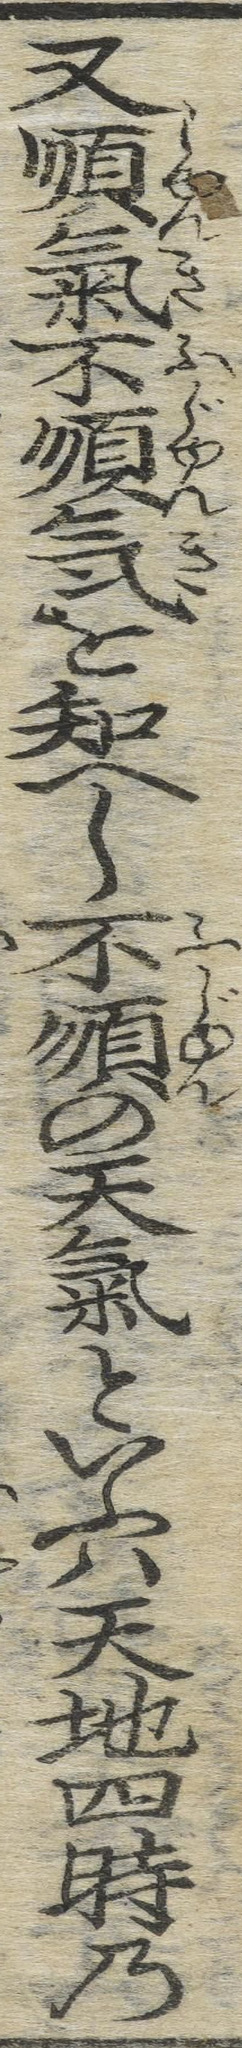又順気不順気を知へし不順の天気といふは天地四時の
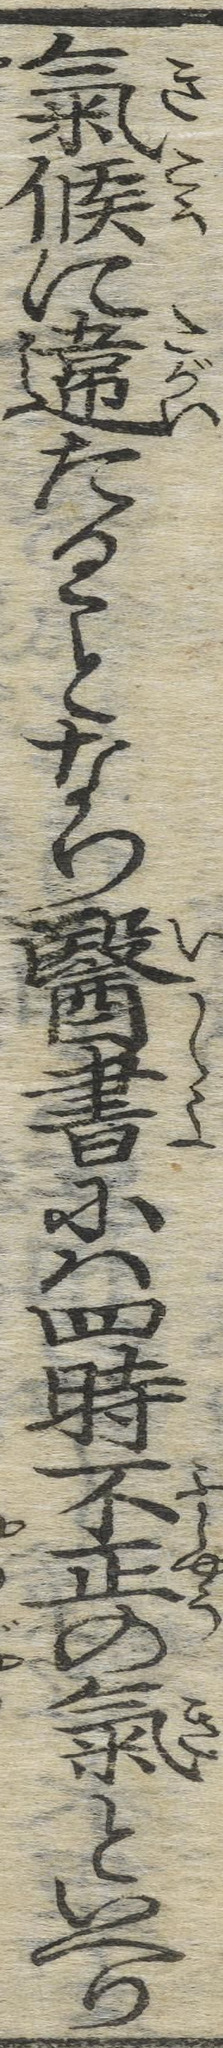気候に違たることなり醫書には四時不正の気といへり
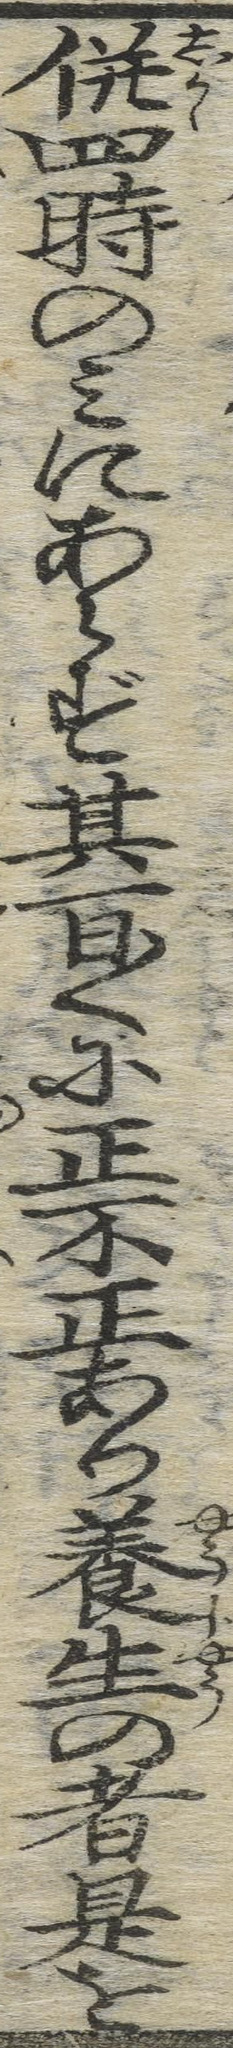併四時のみにあらず其百〳〵に正不正あり養生の者是を
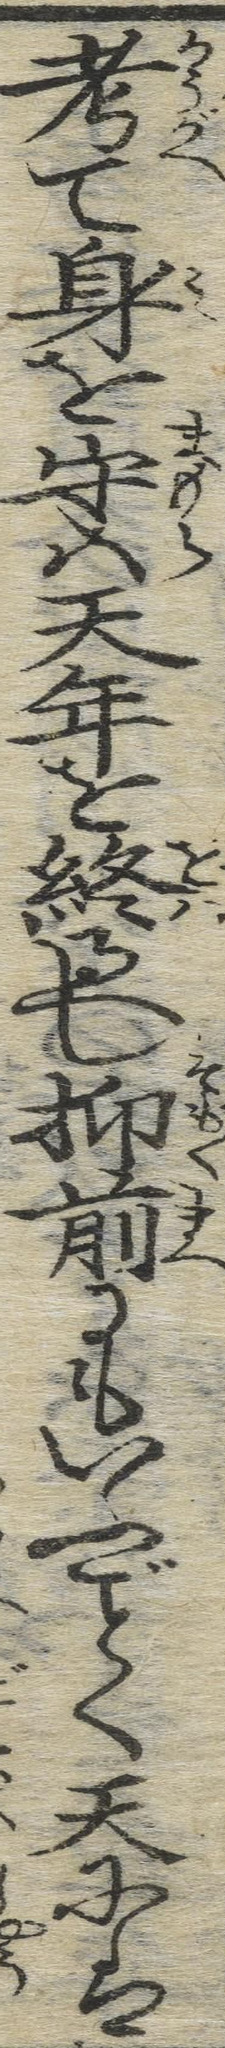考て身を守は天年を終るへし抑前にもいふごとく天には
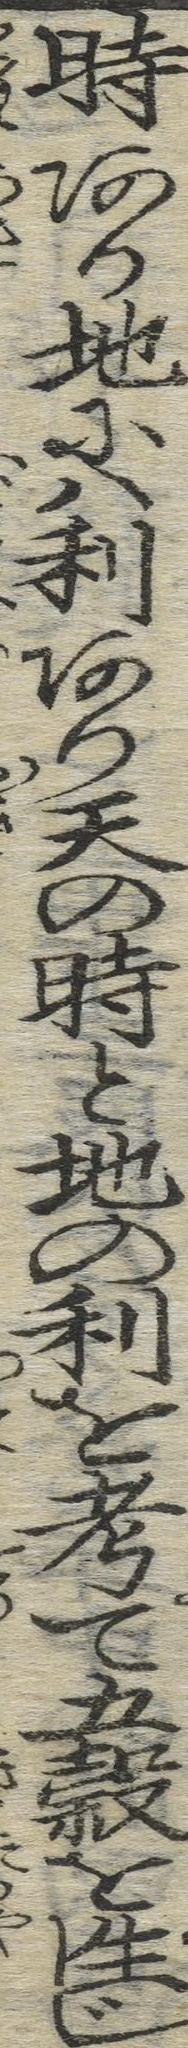時あり地には利あり天の時と地の利を考て五穀を生じ
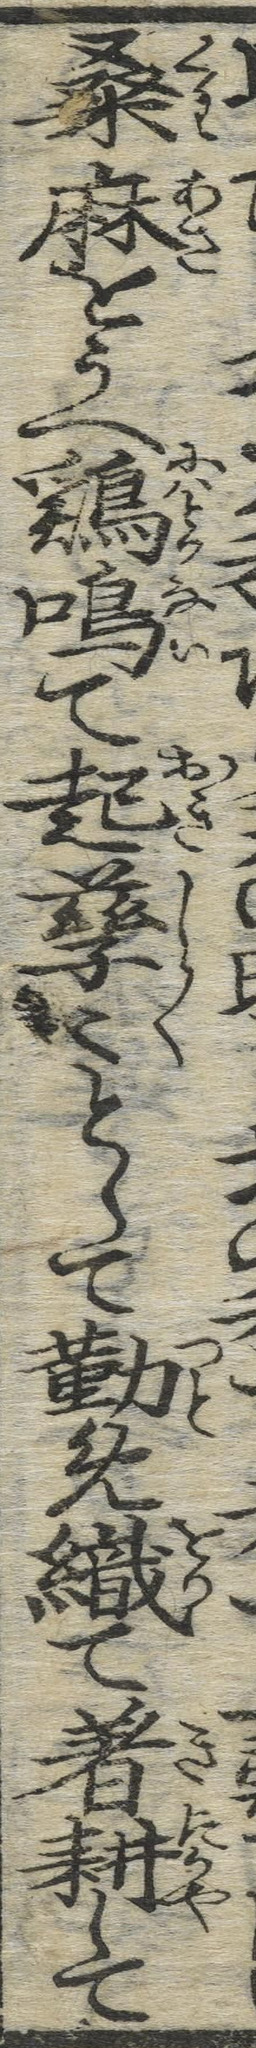桑麻をうへ鶏鳴て起孳ゝとして勤め織て着耕して
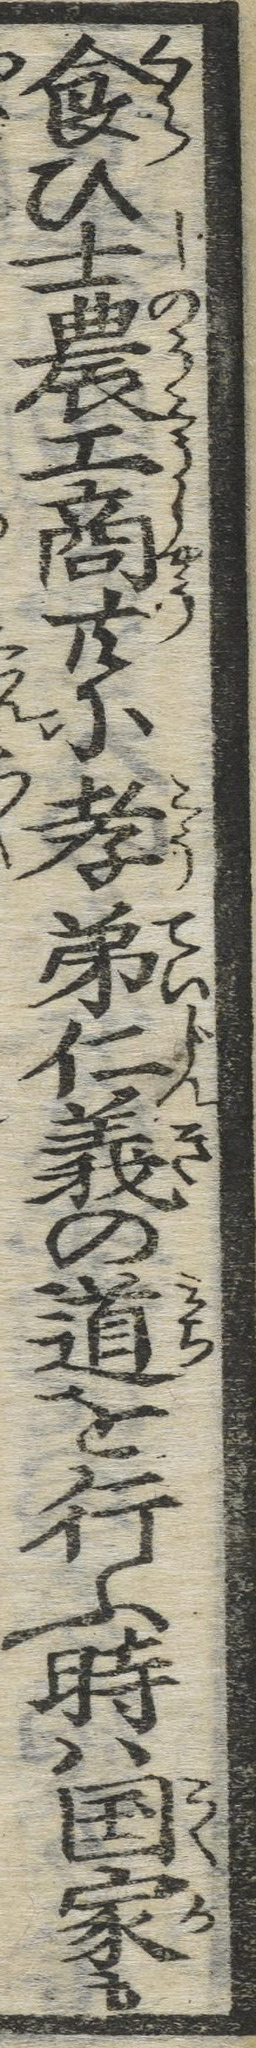食ひ士農工商共に孝弟仁義の道を行ふ時は国家も
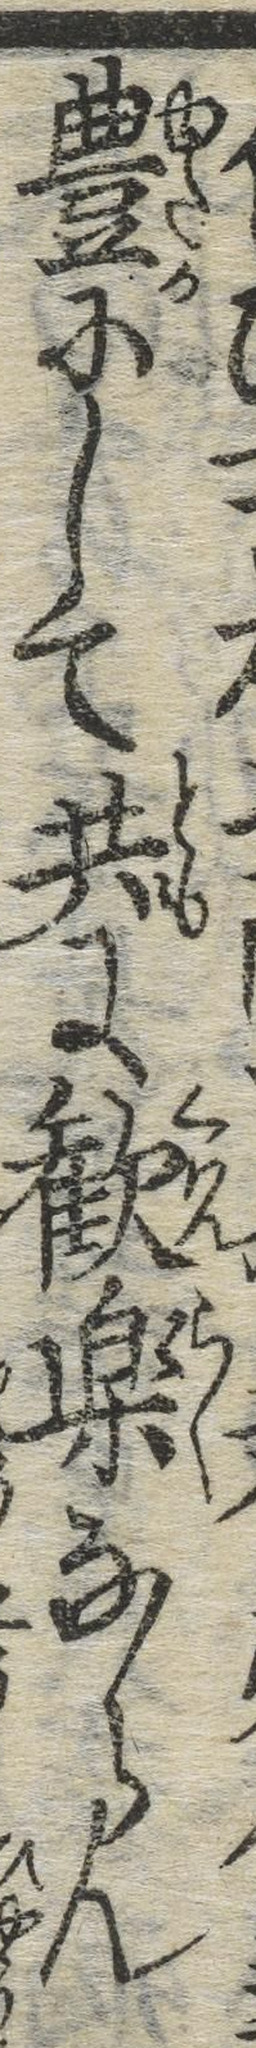豊にして共に歓楽ならん
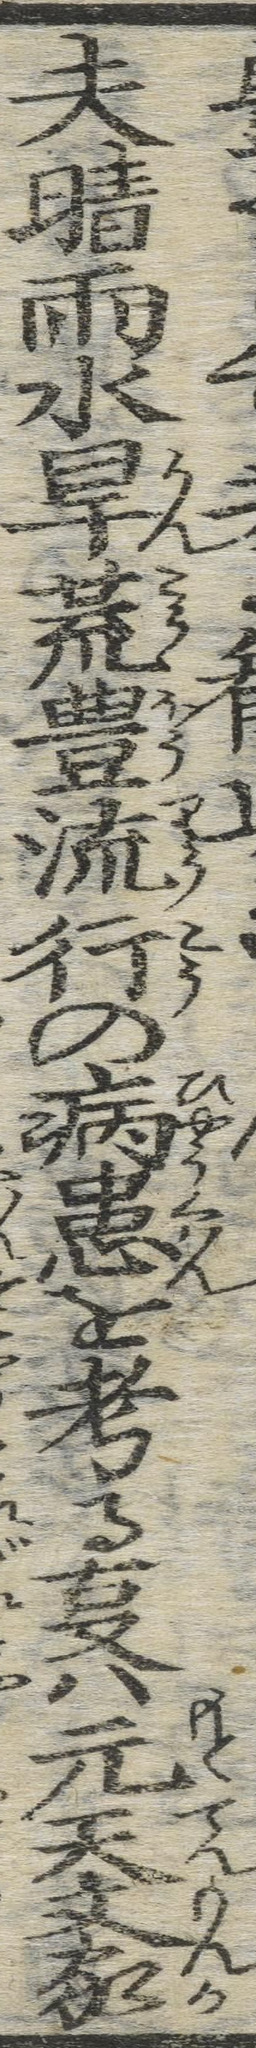夫晴雨水旱荒豊流行の病患を考る事は元天文家
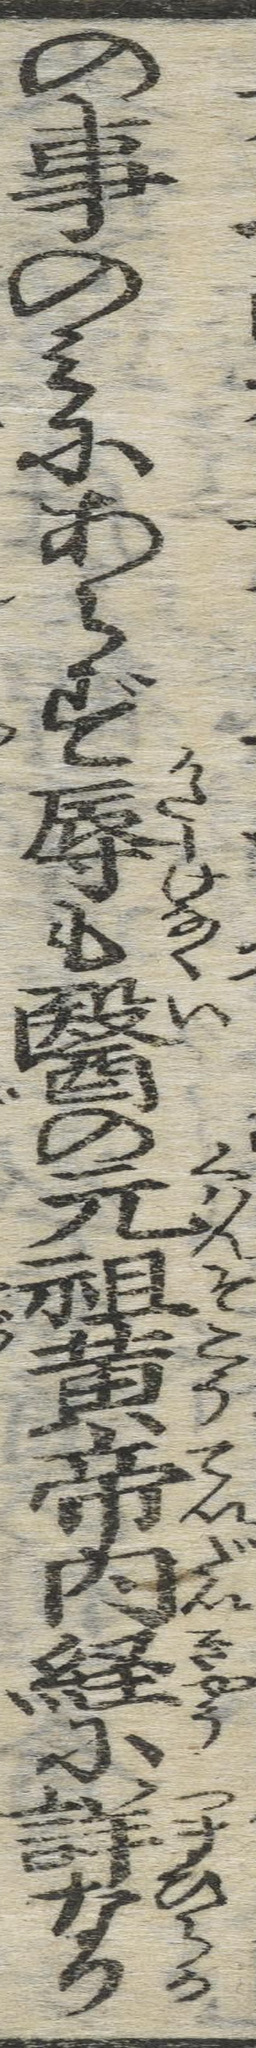の事のみにあらず辱も醫の元祖黄帝内経に詳なり
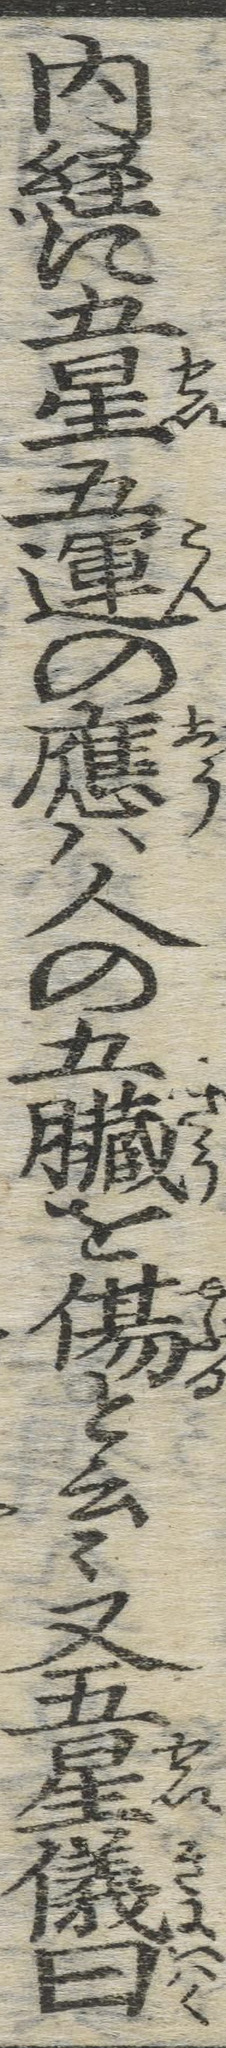内経に五星五運の應は人の五臓を傷と云〻又五星儀曰
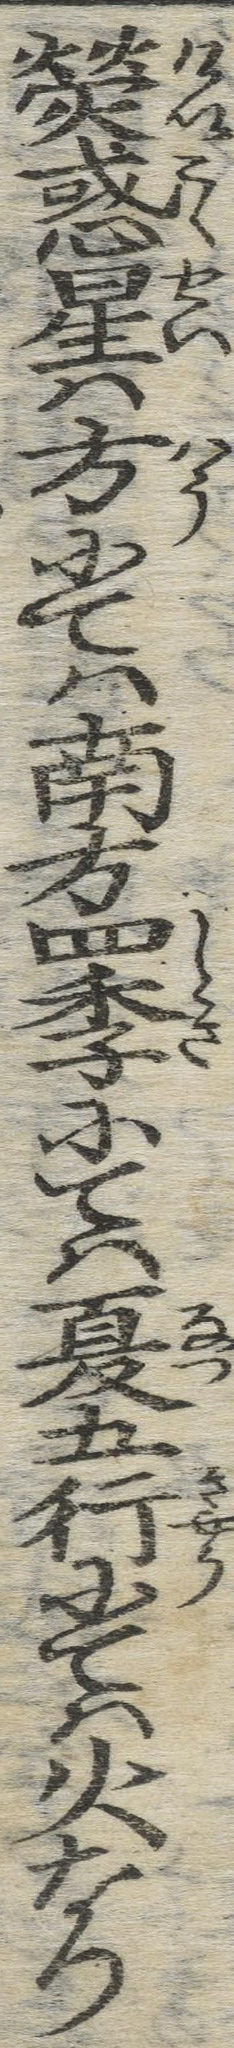熒惑星は方にては南方四季にては夏五行にては火なり
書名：[晴雨考]
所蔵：東京大学地震研究所図書室 Earthquake Research Institute Library, The University of Tokyo, JAPAN
